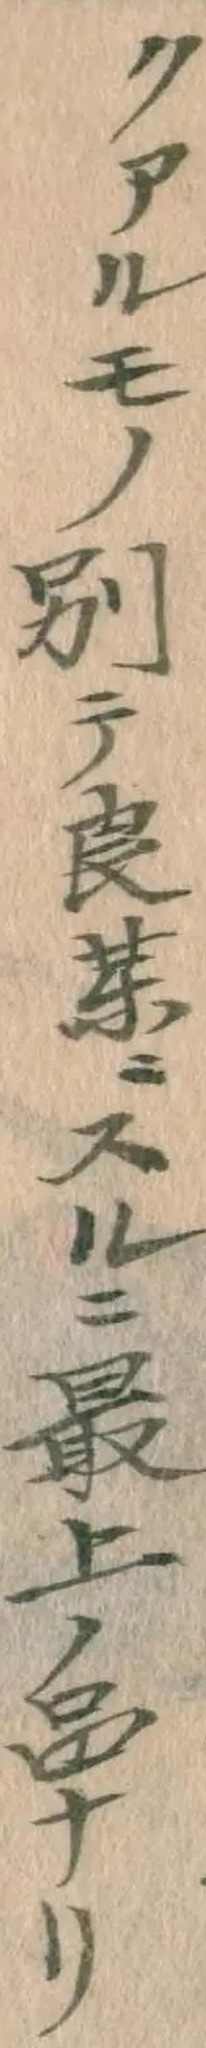クアルモノ別テ良薬ニスルニ最上ノ品ナリ

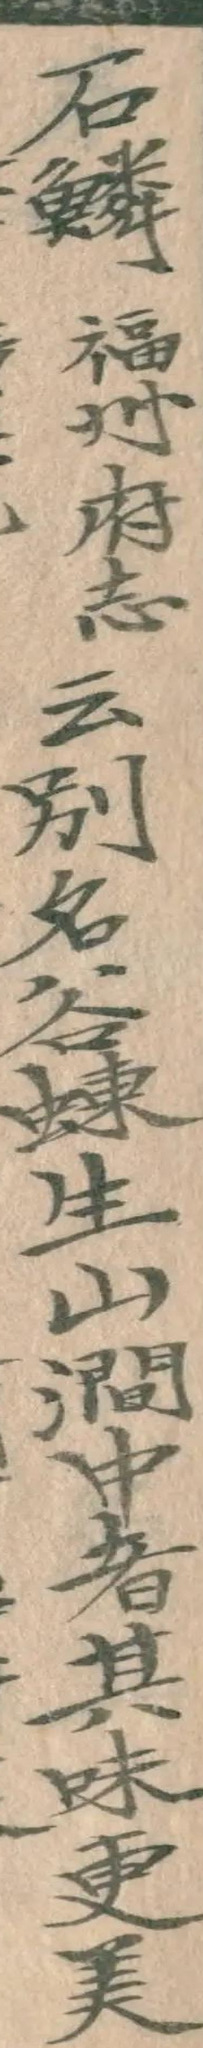石鱗福州府志云別名谷蝀生山澗中者其味更美
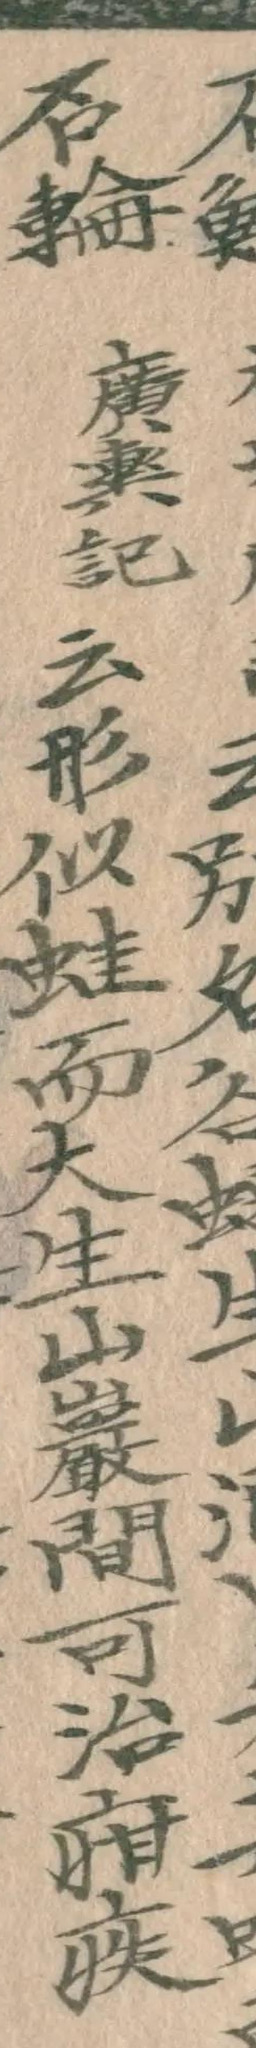石輪廣輿記云形似蛙而大生山巌間可治疳疾
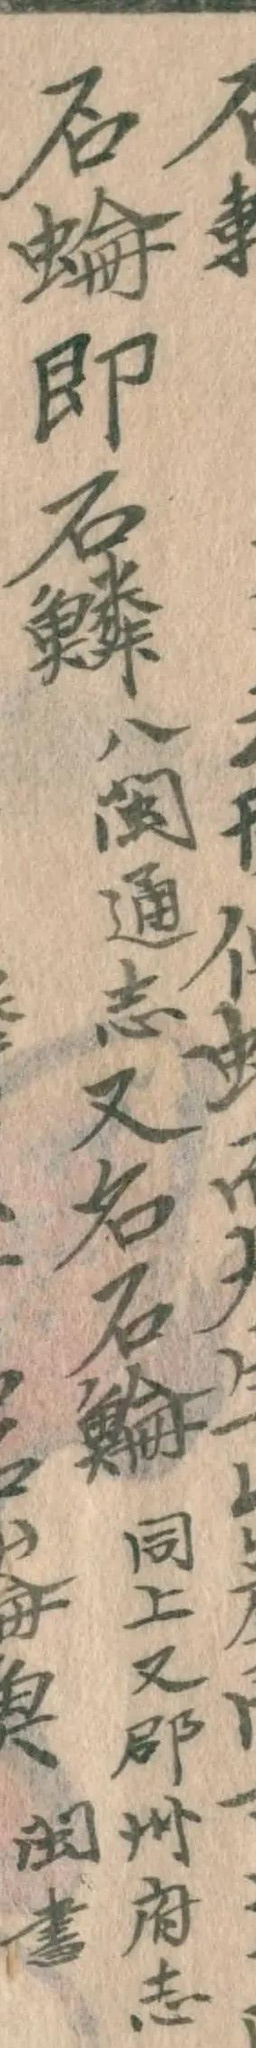石蜦即石鱗八閩通志又名石鯩同上又州府志
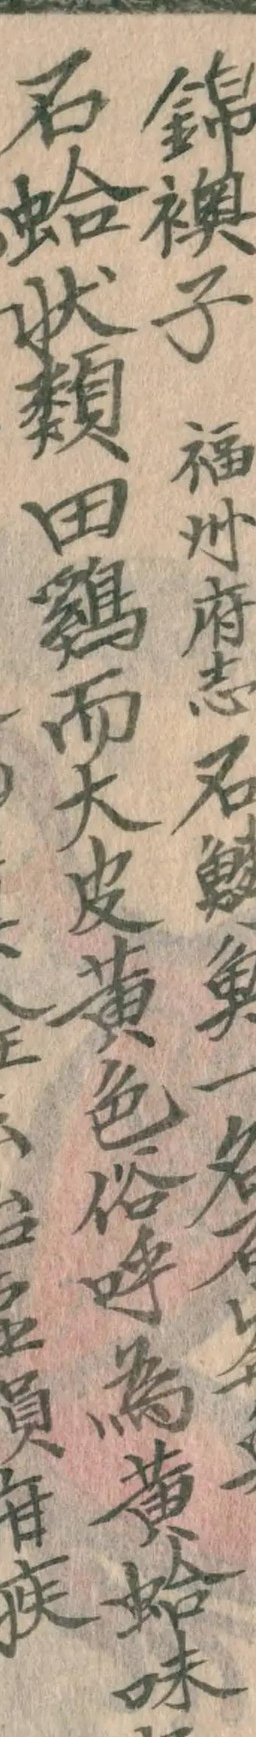石蛤状類田鶏而大皮黄色俗呼為黄蛤味極美
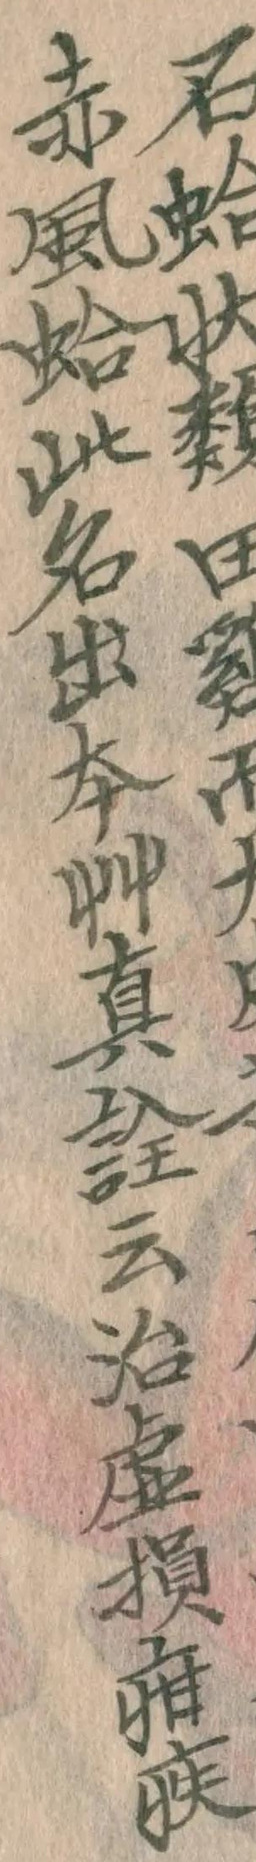赤風蛤此名出本草真詮云治虚損疳疾

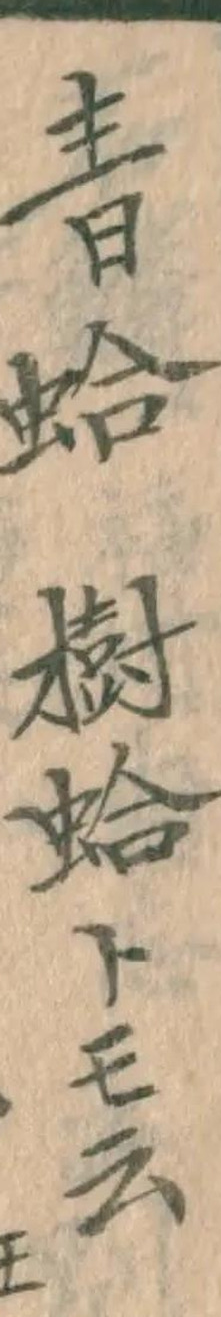青蛤樹蛤トモ云
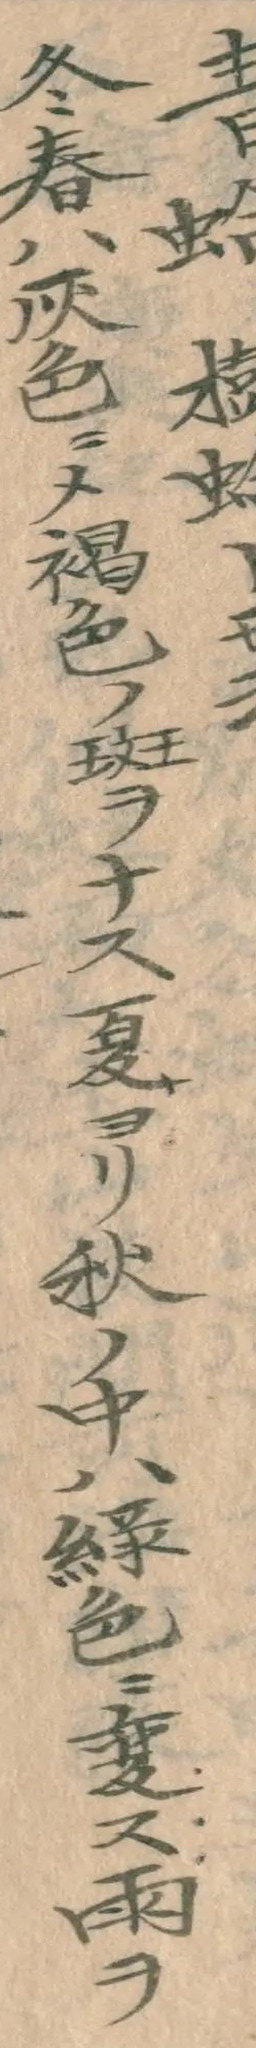冬春ハ灰色ニシテ褐色ノ斑ヲナス夏ヨリ秋ノ中ハ緑色ニ変ス雨ヲ
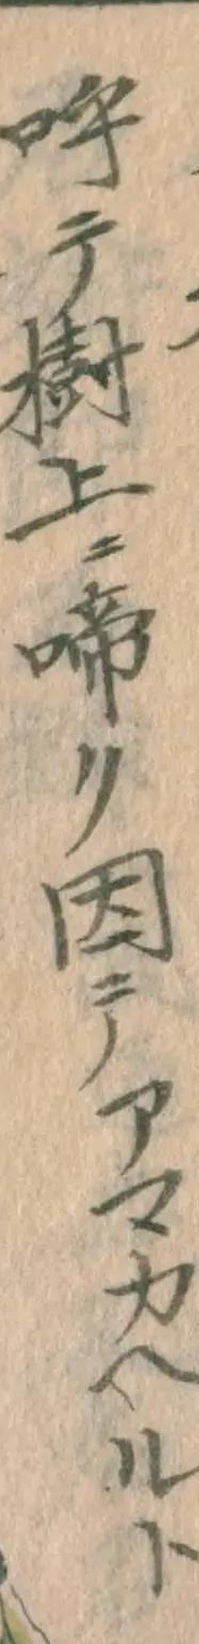呼テ樹上ニ啼ク因テアマカヘルト
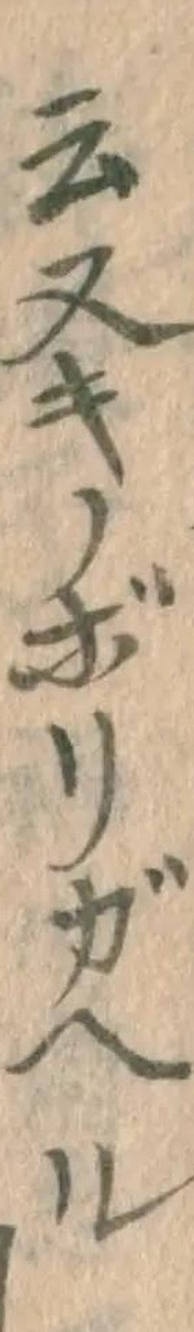云又キノボリガヘル
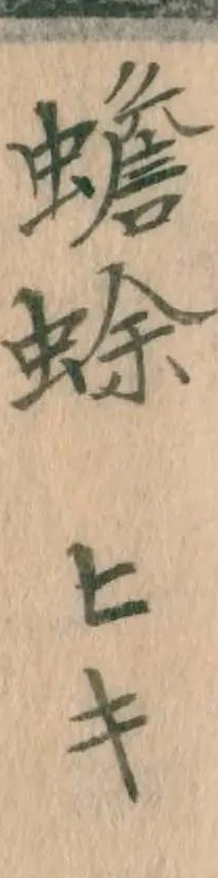蟾蜍ヒキ

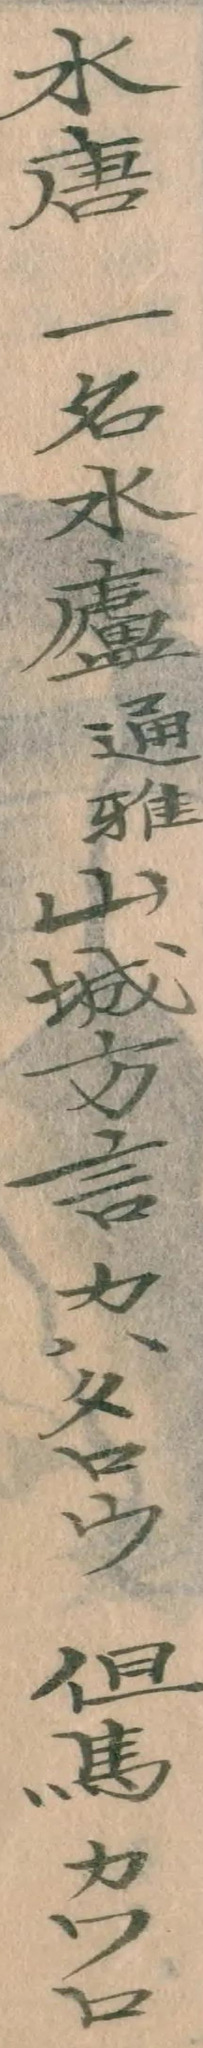水唐一名水廬通雅山城方言カハタロウ但馬カワロ
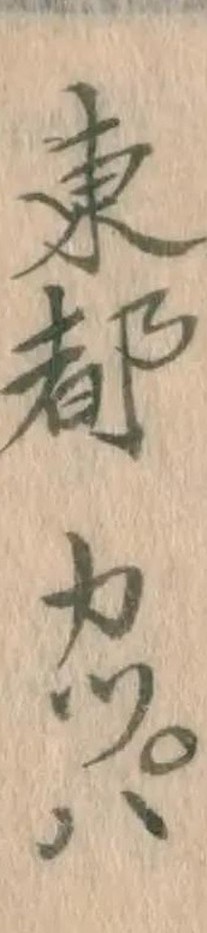東都カツパ
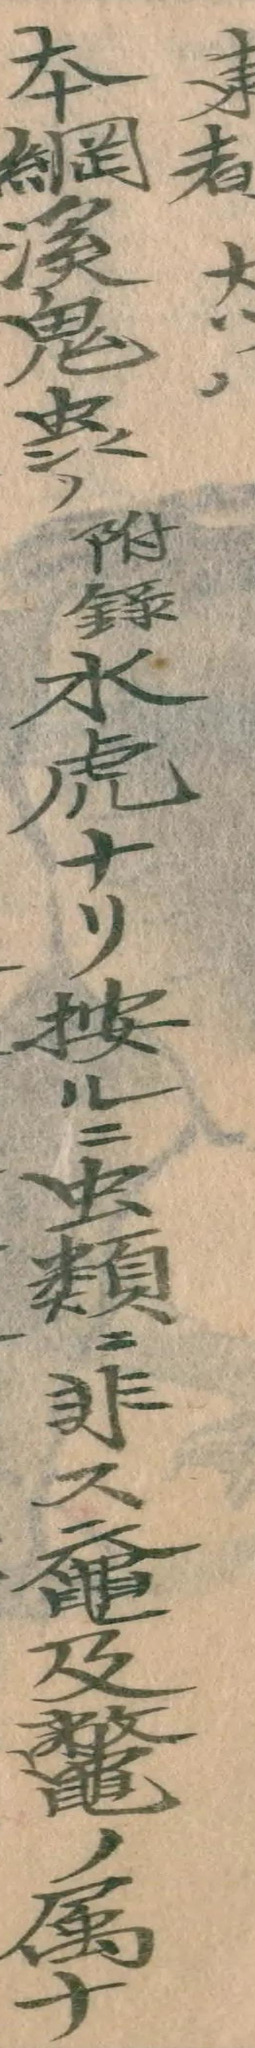本綱渓鬼蟲ノ附録水虎ナリ按ルニ虫類ニ非ス黿及び鼈ノ属ナ
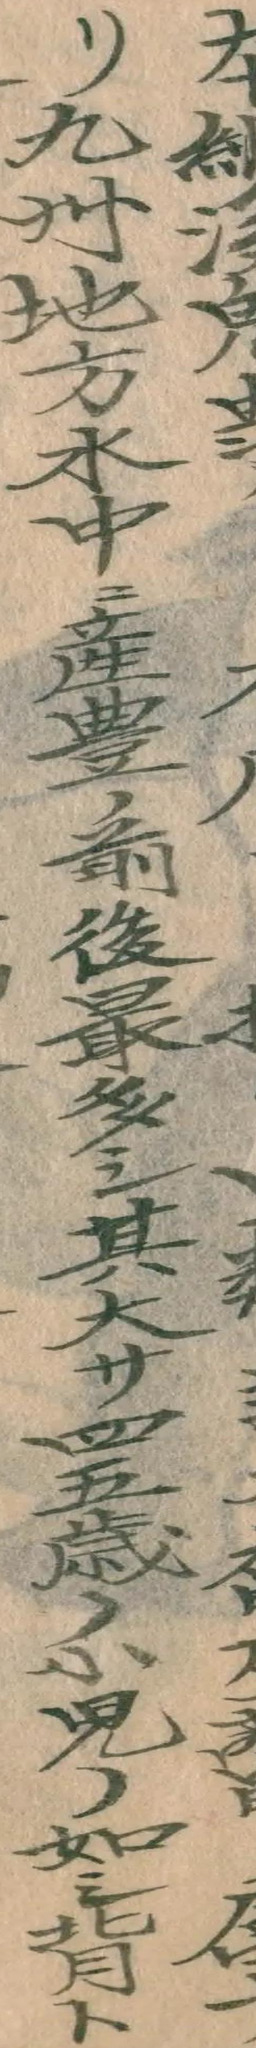リ九州地方水中ニ産豊ノ前後最多シ其大サ四五歳ノ小児ノ如シ背ト
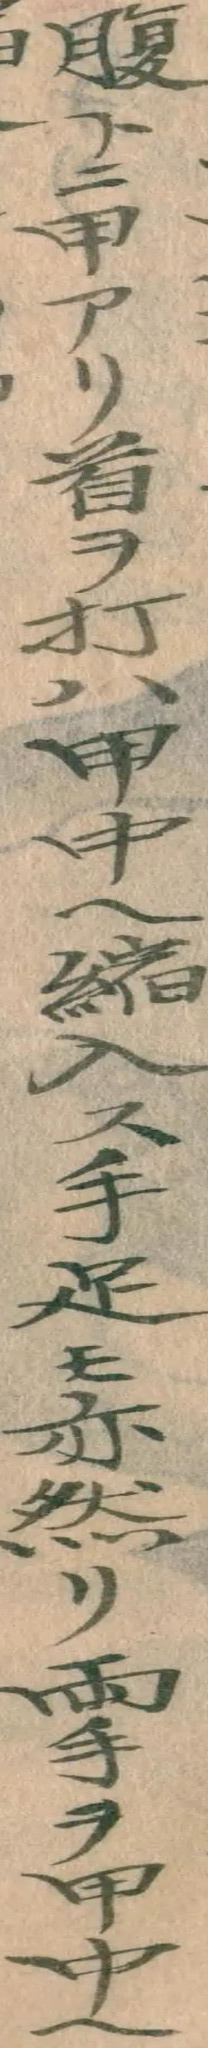腹トニ甲アリ首ヲ打ハ甲中ヘ縮入ス手足モ亦然リ両手ヲ甲中ヘ
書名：千蟲譜 3巻. [3]
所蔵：国立国会図書館 National Diet Library, JAPAN
